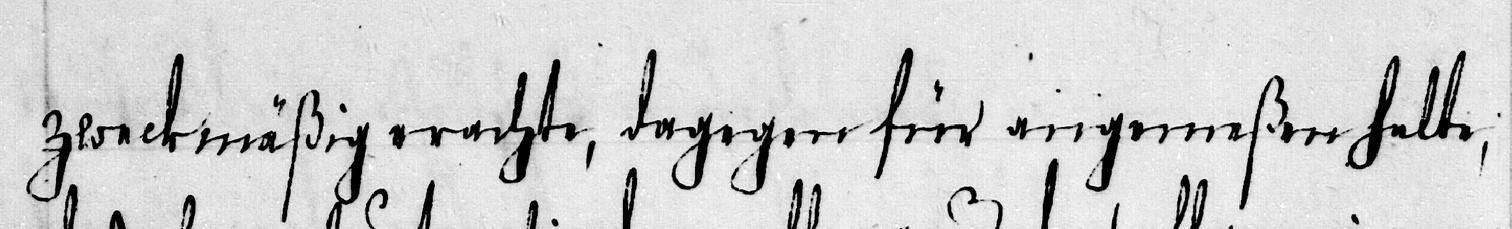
zweckmäßig erachte, dagegen für angemeßen halte,
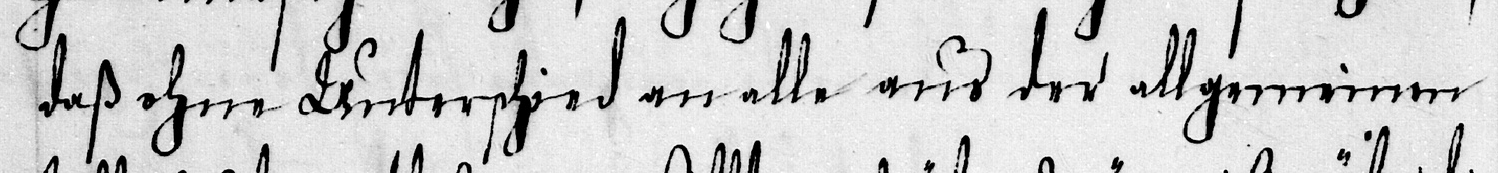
daß ohne Unterschied an alle aus der allgemeinen
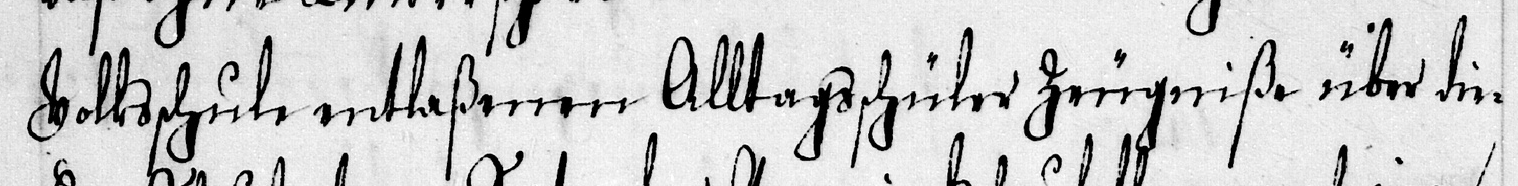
Volksschule entlaßenen Alltagsschüler Zeugniße über die¬
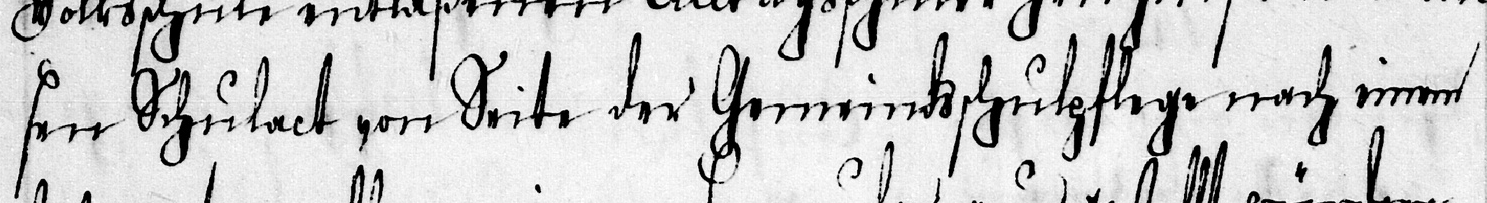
sen Schulact von Seite der Gemeindsschulpflege nach einem
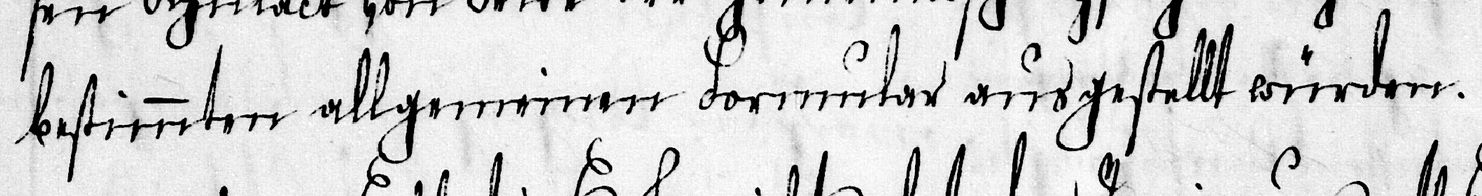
bestimmten allgemeinen Formular ausgestellt würden.
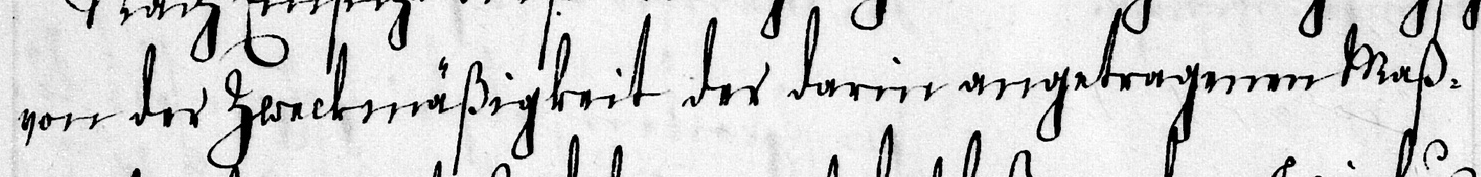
von der Zweckmäßigkeit der darin angetragenen Maß¬
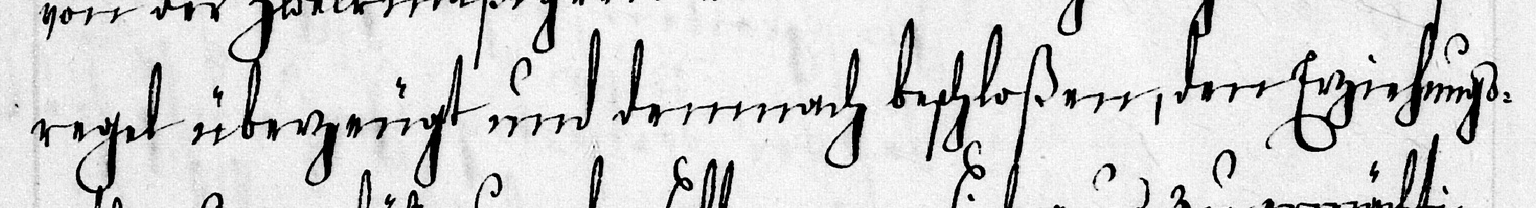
regel überzeugt und demnach beschloßen, den Erziehungs¬
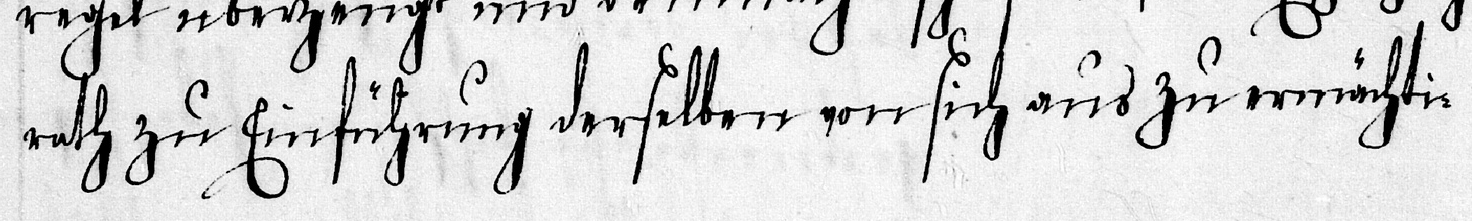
rath zu Einführung derselben von sich aus zu ermächti¬
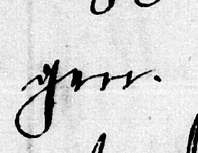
gen.
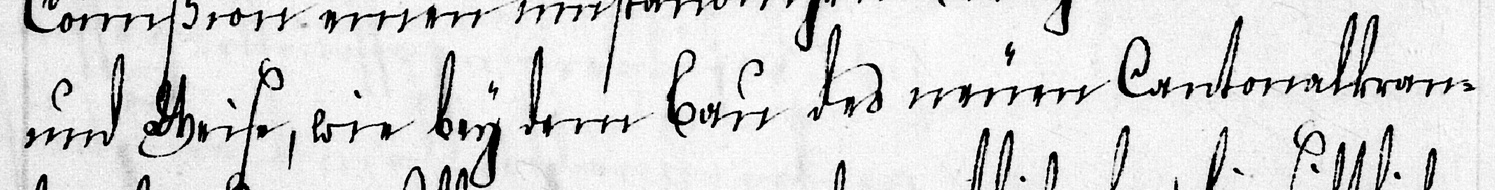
und Weise, wie bey dem Bau des neuen Cantonalkran¬
